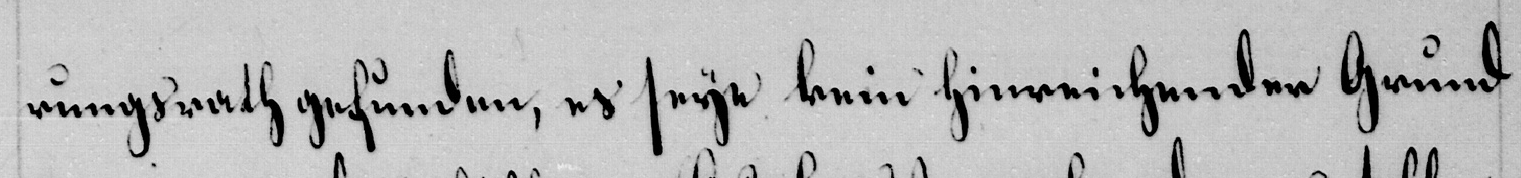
rungsrath gefunden, es seye kein hinreichender Grund
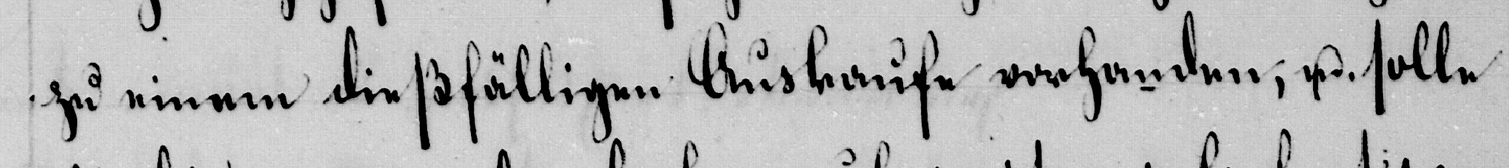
zu einem dießfälligen Auskaufe vorhanden, u. solle
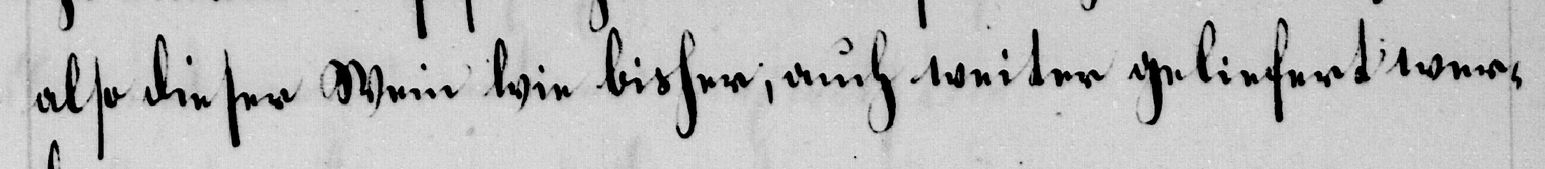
also dieser Weise wie bisher, auch weiter geliefert wer¬
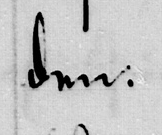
den.
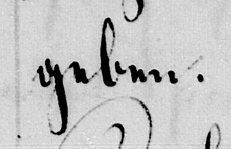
geben.
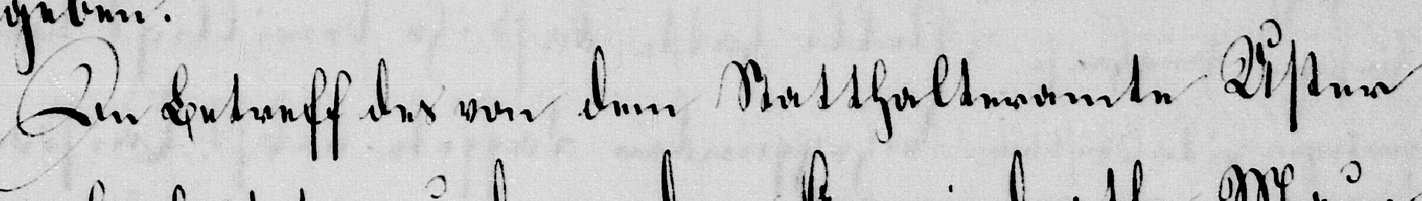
In Betreff des von dem Statthalteramte Uster
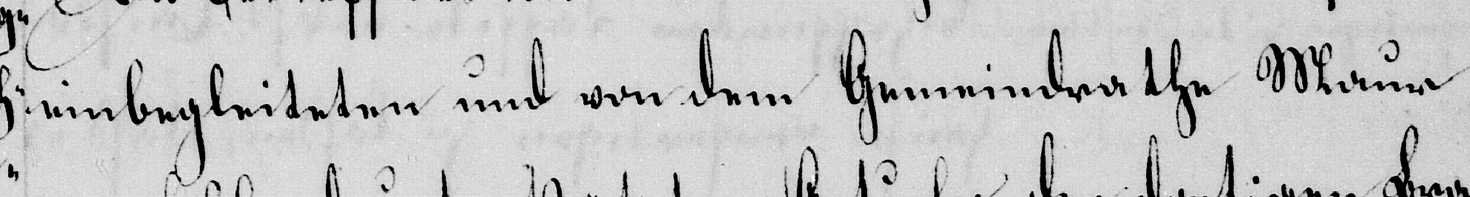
einbegleiteten und von dem Gemeindrathe Maur
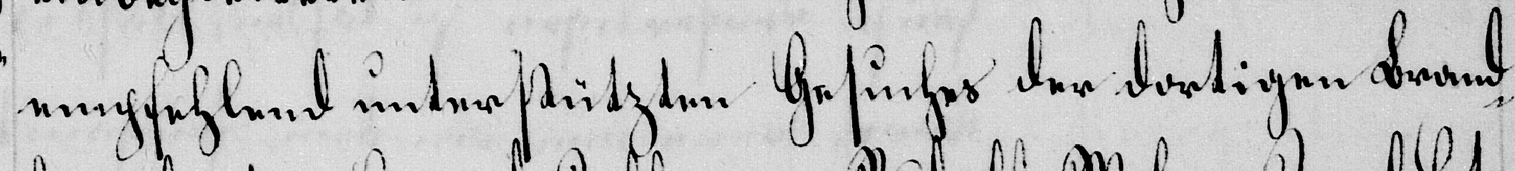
empfehlend unterstützten Gesuches der dortigen Brand¬
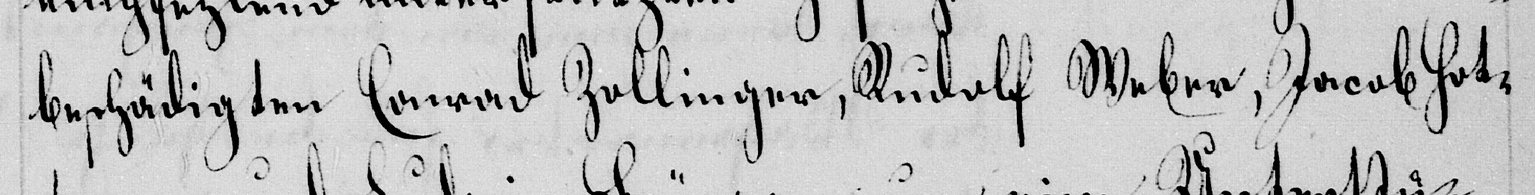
beschädigten Conrad Zollinger, Rudolf Weber, Jacob Hot¬
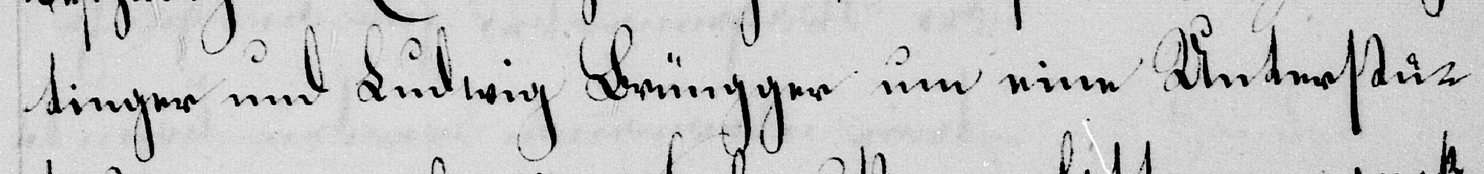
tinger und Ludwig Brüngger um eine Unterstü¬
